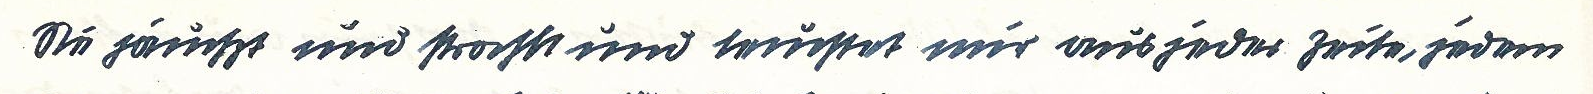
Sie jauchzt und strahlt und leuchtet mir aus jeder Zeile, jedem
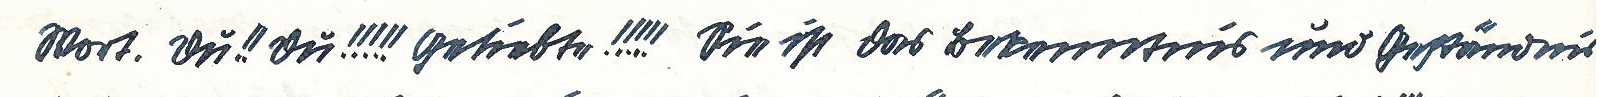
Wort. Du!! Du!!!!! Geliebte!!!!! Sie ist das Bekenntnis und Geständnis
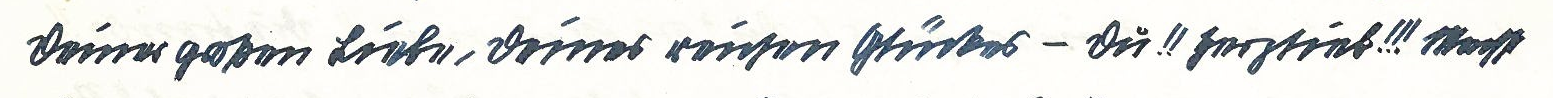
Deiner großen Liebe, Deines reichen Glückes – Du!! Herzlieb!!! Machst
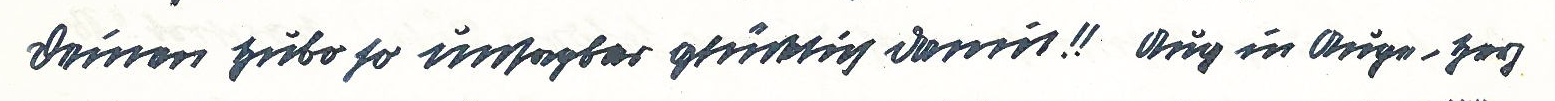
Deinen Hubo so unsagbar glücklich damit!! Aug in Auge, Herz
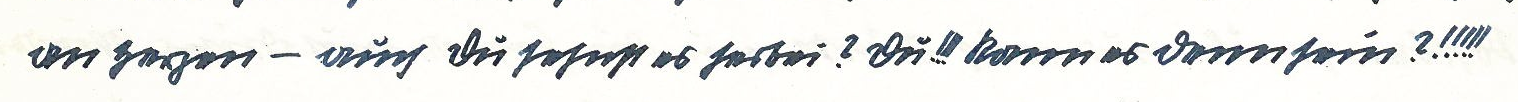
an Herzen – auch Du sehnst es herbei? Du!!! Kann es denn sein?!!!!!
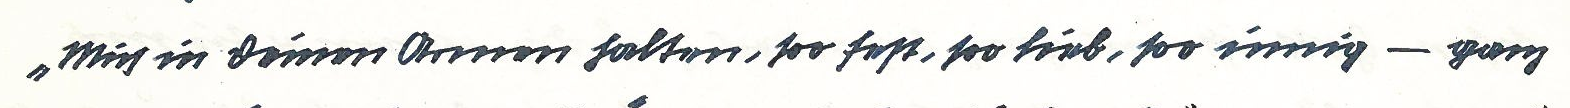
„Mich in Deinen Armen halten, soo fest, soo lieb, soo innig – ganz
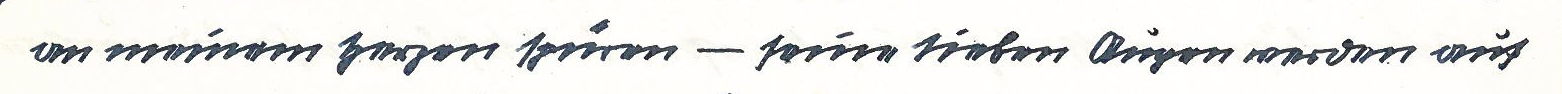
an meinem Herzen spüren – seine lieben Augen werden auf
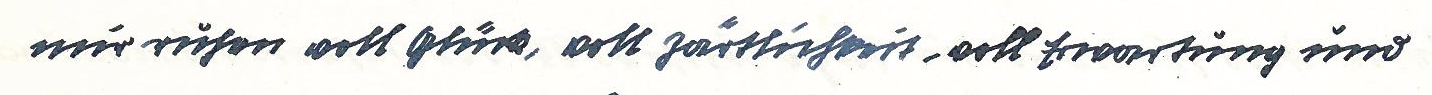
mir ruhen voll Glück, voll Zärtlichkeit, voll Erwartung und
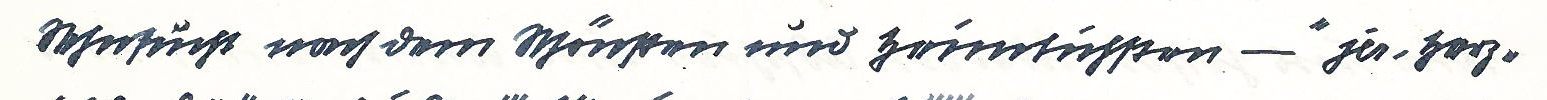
Sehnsucht nach dem Schönsten und Heimlichsten – ” ja, Herz¬
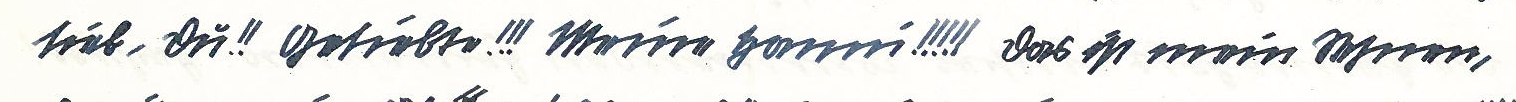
lieb, Du!! Geliebte!!! Meine!!!!! Das ist mein Sehnen,
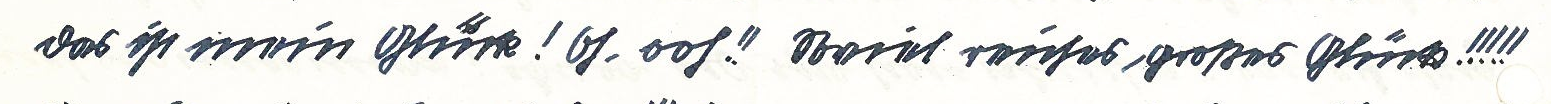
das ist mein Glück! Oh, ooh!! Soviel reiches, großes Glück!!!!!
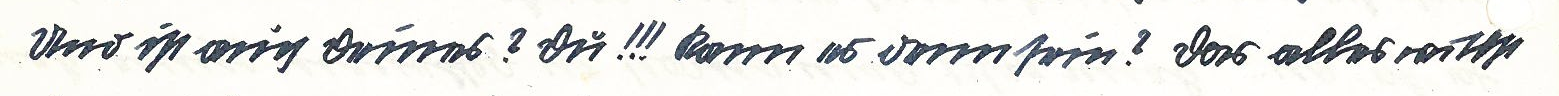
Und ist auch Deines? Du!!! Kann es denn sein? Das alles willst
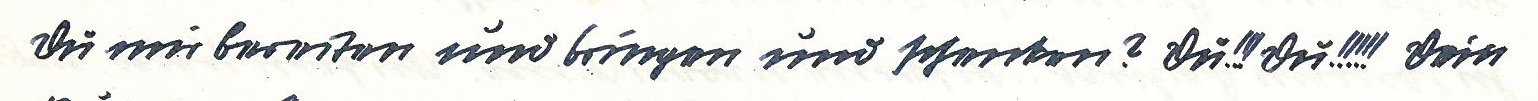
Du mir bereiten und bringen und schenken? Du!!! Du!!!!! Dein
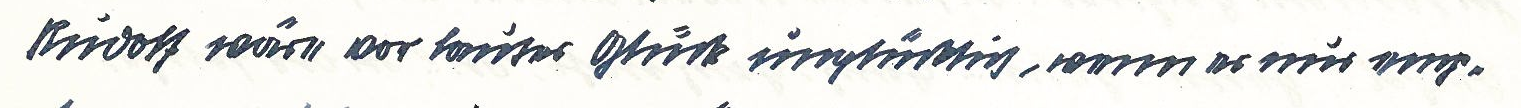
Rudolf wäre vor lauter Glück unglücklich, wenn er nur emp¬
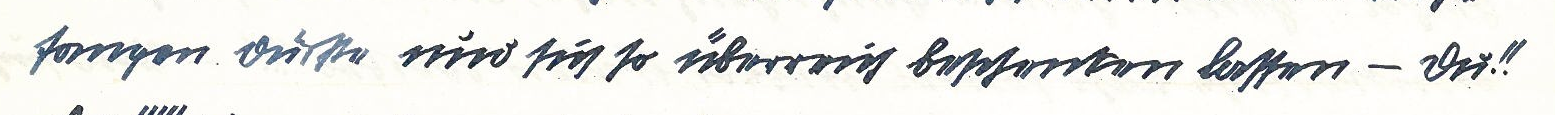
fangen dürfte und sich so überreich beschenken lassen – Du!!
